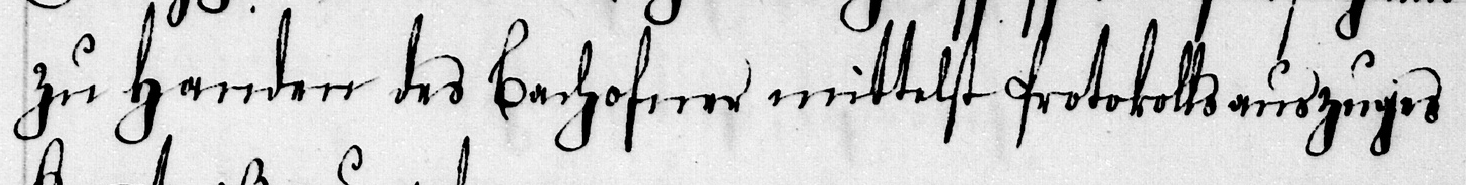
zu Handen des Bachofner mittelst Protokollsauszuges
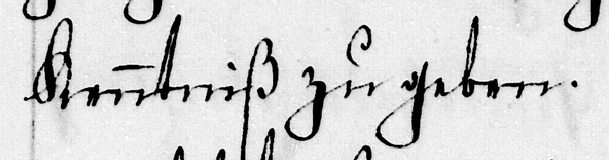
Kenntniß zu geben.
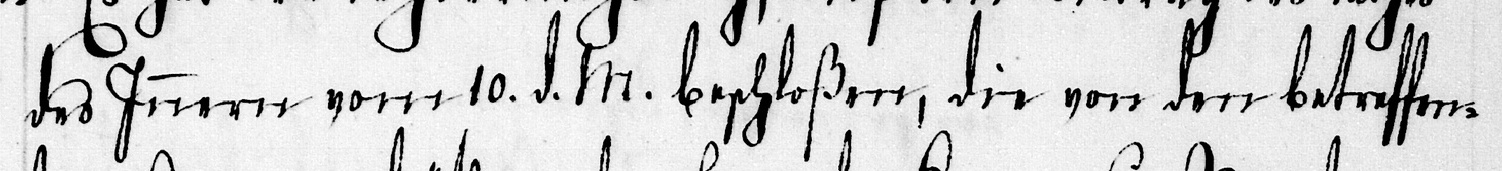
des Innern vom 10. d. M. beschloßen, die von den betreffen¬
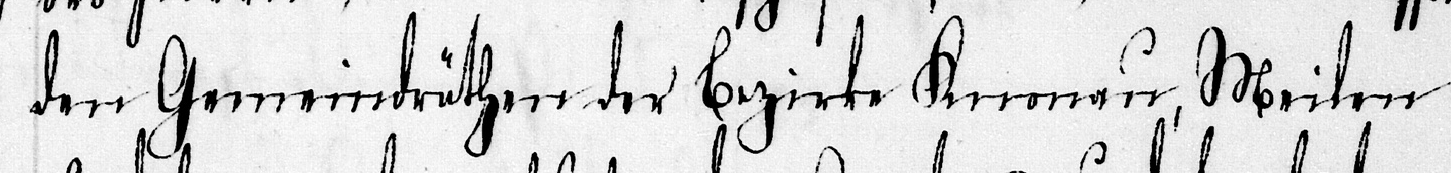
den Gemeindräthen der Bezirke Knonau, Meilen
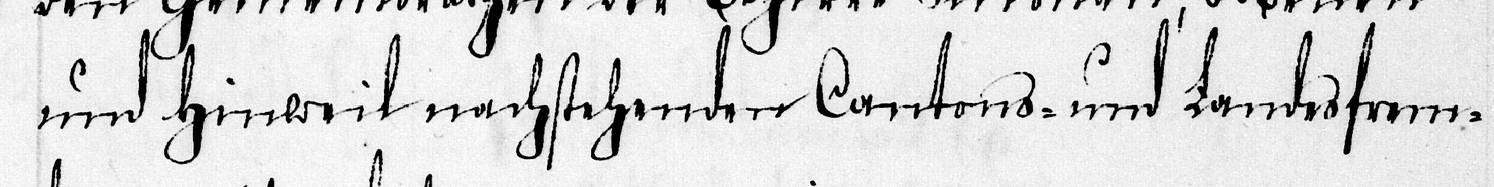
und Hinweil nachstehenden Cantons- und Landesfrem¬
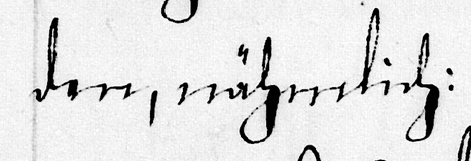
den, nähmlich:
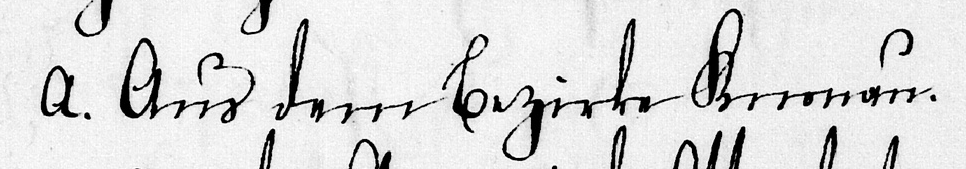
A. Aus dem Bezirke Knonau.
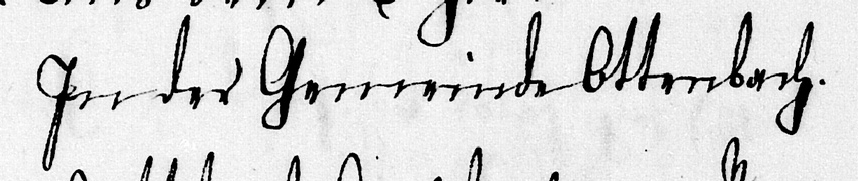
In der Gemeinde Ottenbach.
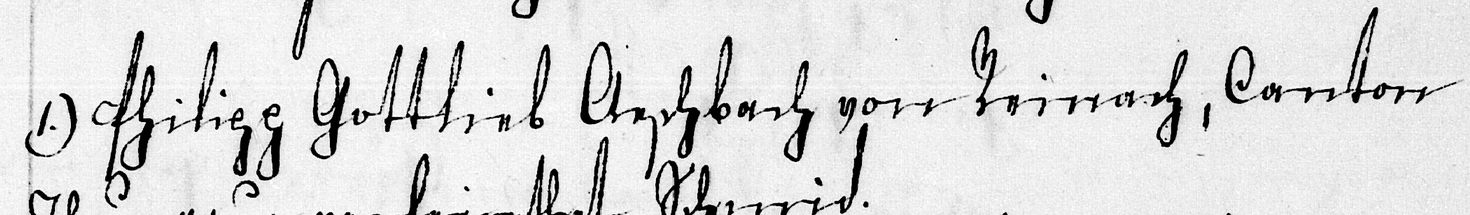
1.) Philipp Gottlieb Oeschbach von Reinach, Canton
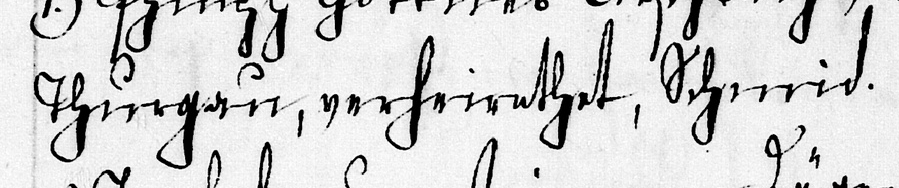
Thurgau verheirathet, Schmid.
